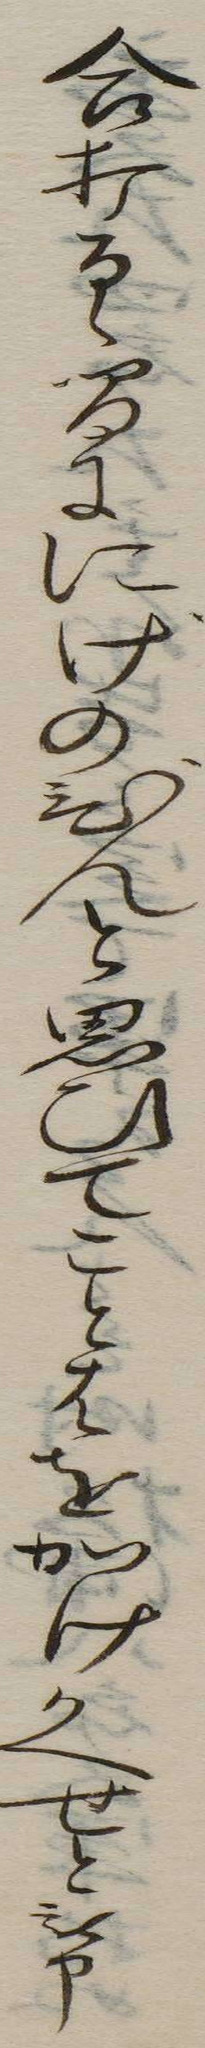合打るゝ間ににげのびんと思ひてことはをかけかへせと被申
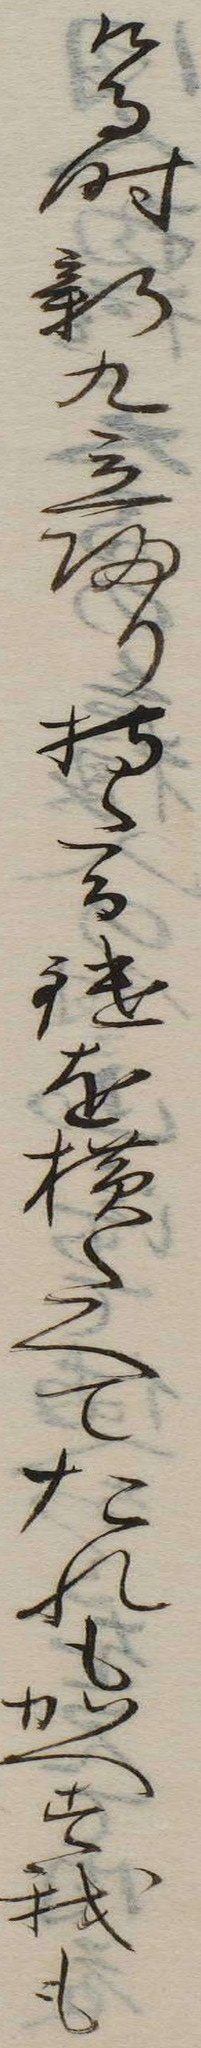ける時新九立帰り持たる鑓を横たへてたれもかへす我も
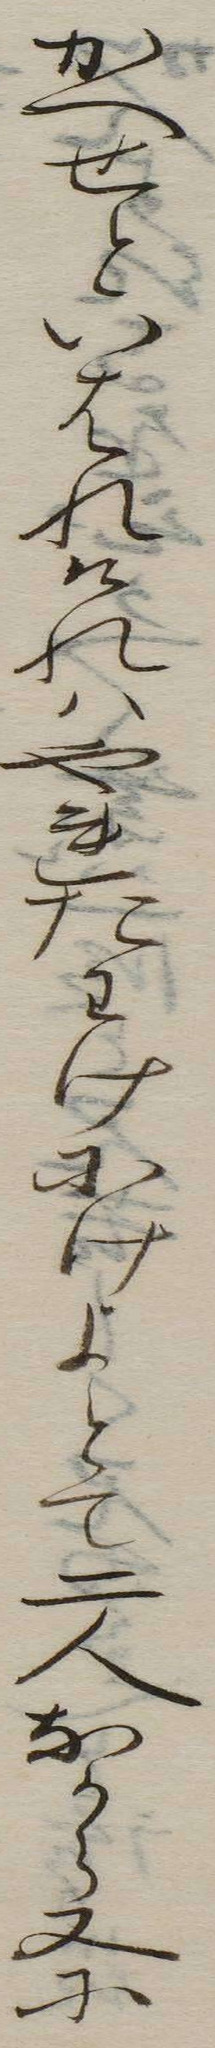かへせといはれけれハやれたわけにけよとて二人なから又に
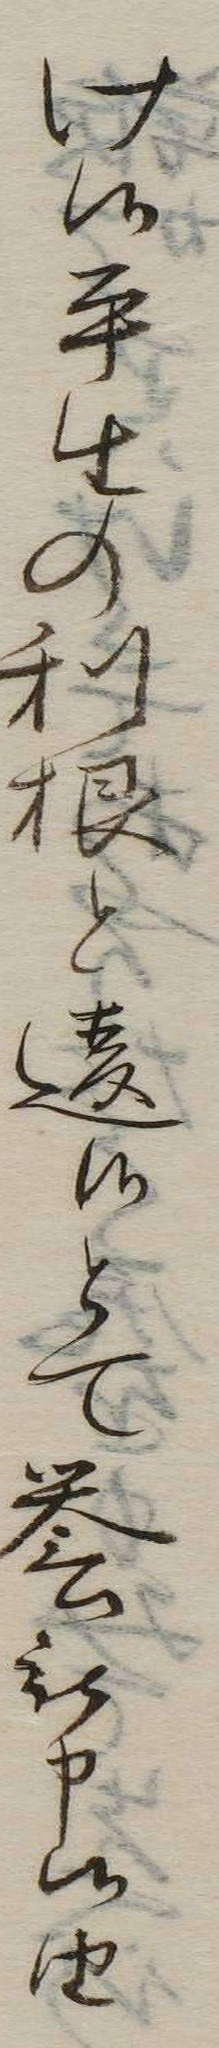け候平生の利根と違候とて誉被申候由
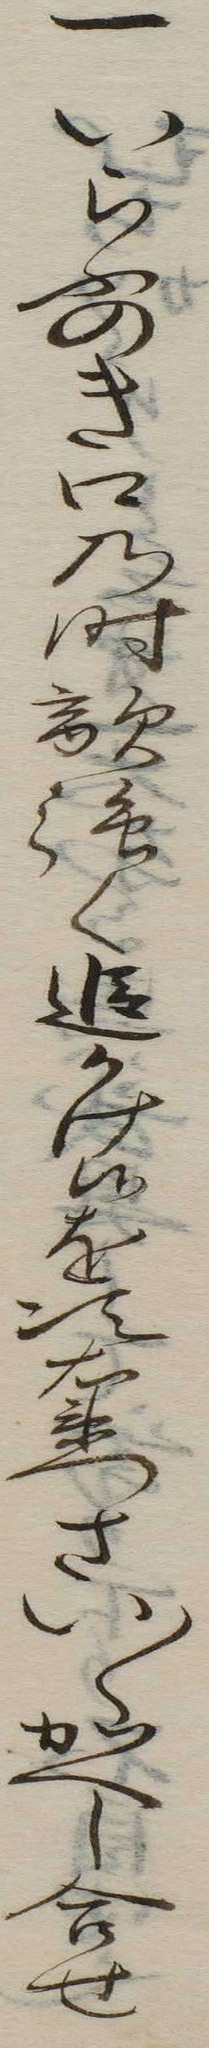一いらふのき口の時敵強く追かけ候を次右衛門さい〳〵かへし合せ
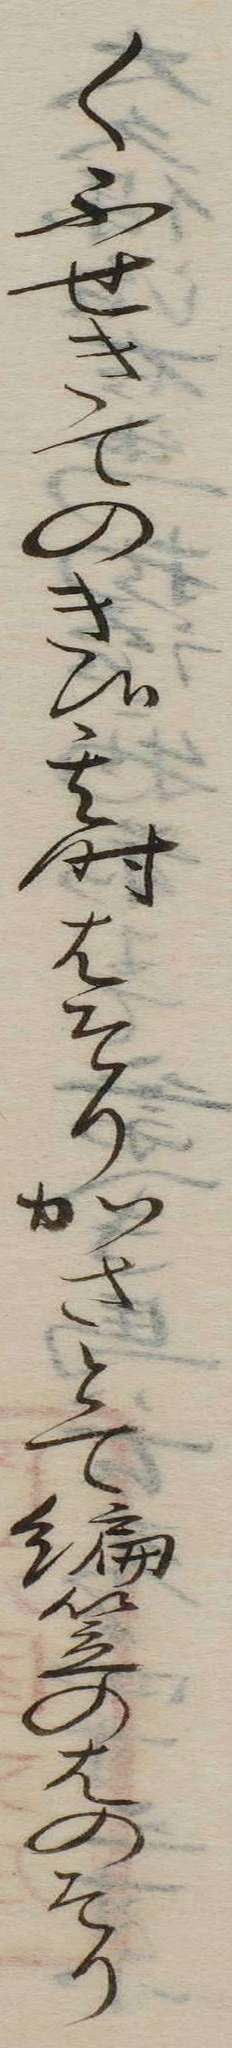〳〵ふせきてのき候其時はそりかさとて編笠のはのそり
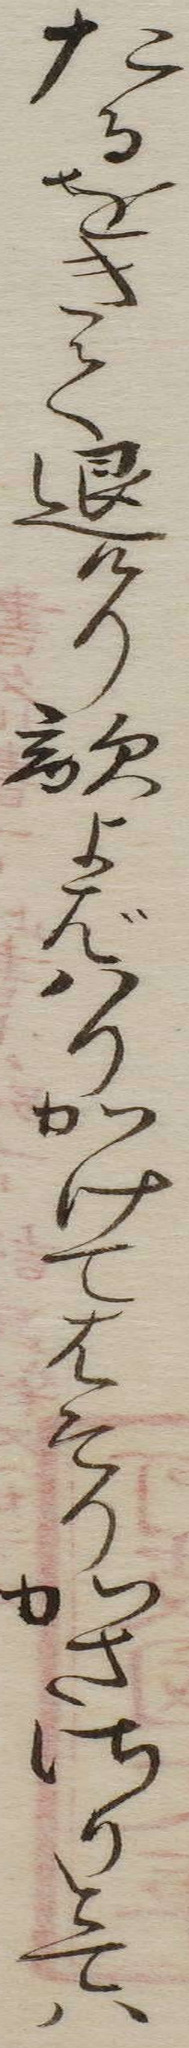たるをきて退けり敵よばハりかけてはそりかささりとてハ
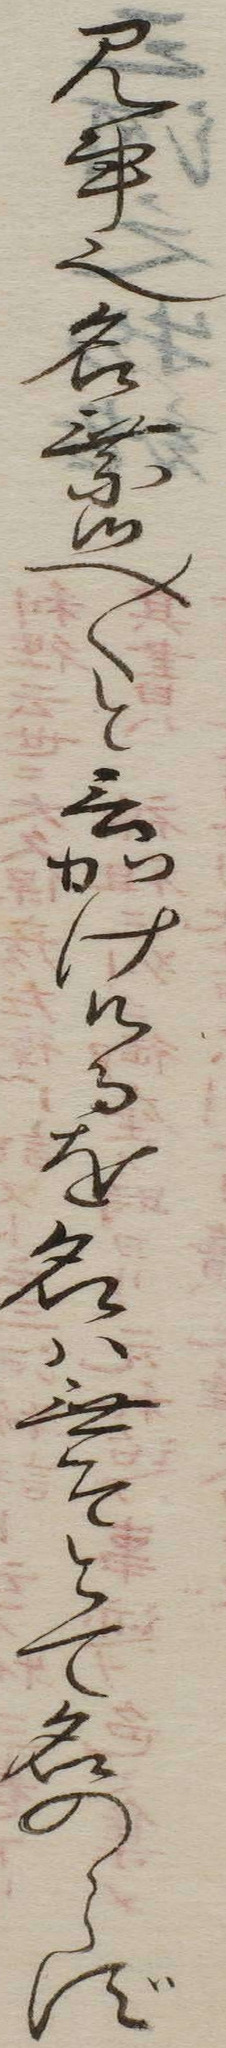見事也名乗候へ〳〵と言かけけるを名ハ無そとて名のらず
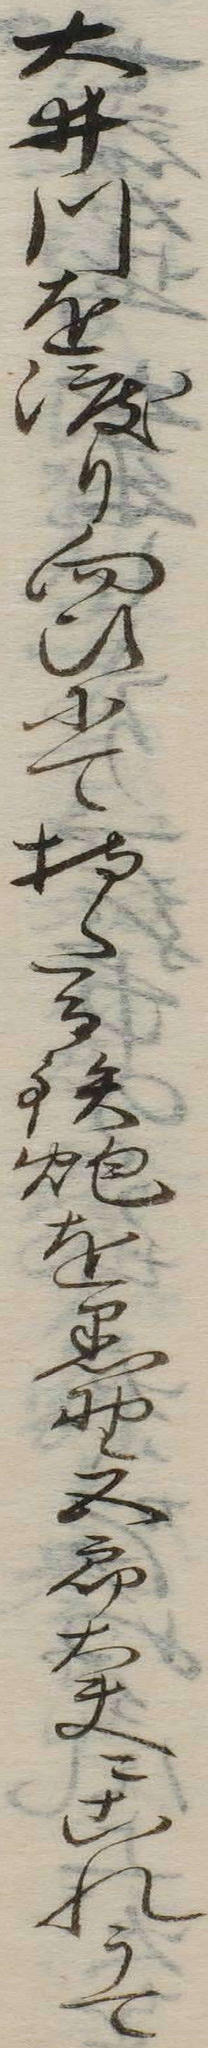大井川を渡り向ひにて持たる鉄炮を黒野五郎大夫ニこれうて
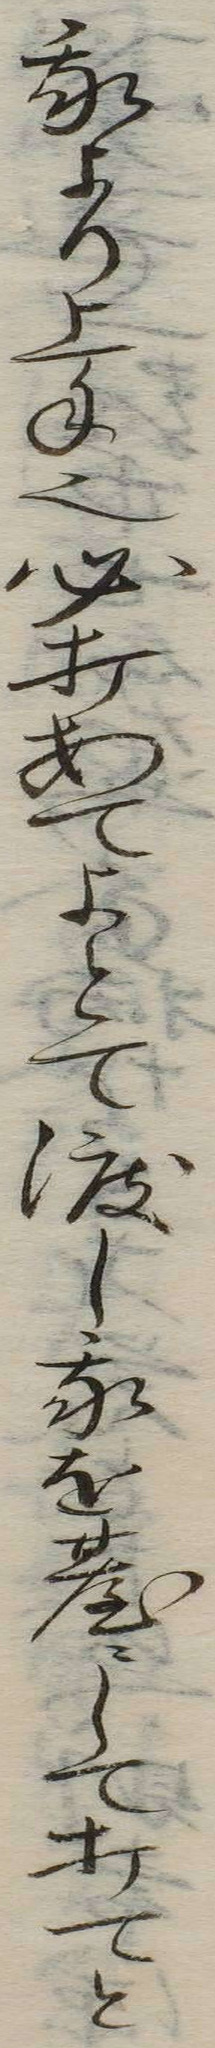我より上手也必打あてよとて渡し我を台ニして打てと
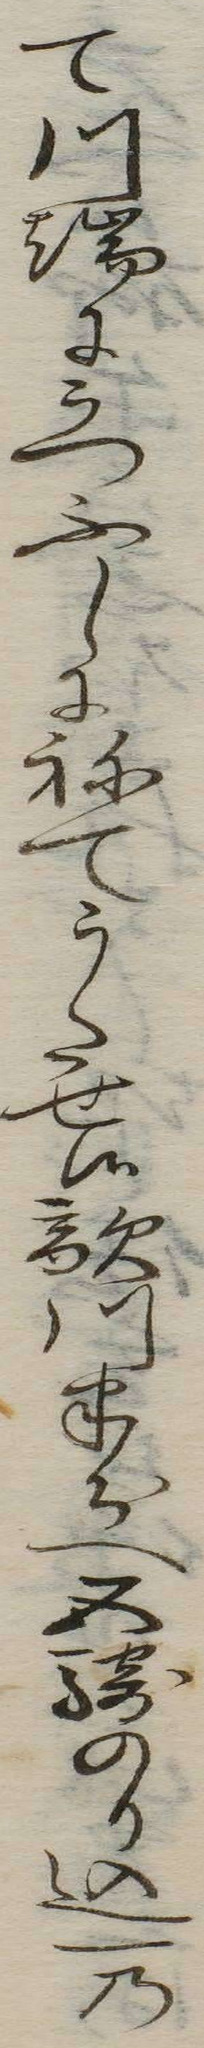て川端にうつふしにねてうたせ候敵川半分へ五騎のり込一の
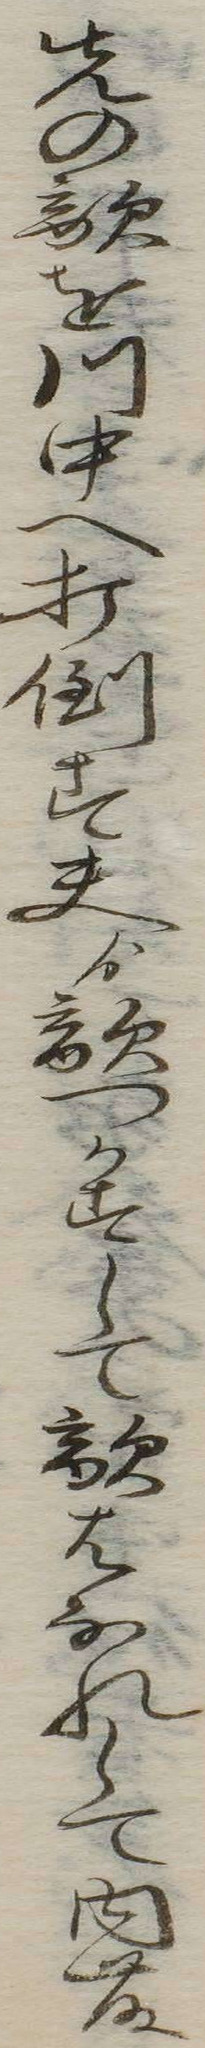先の敵を川中へ打倒す夫ゟ敵つかすして敵はなれして内藤
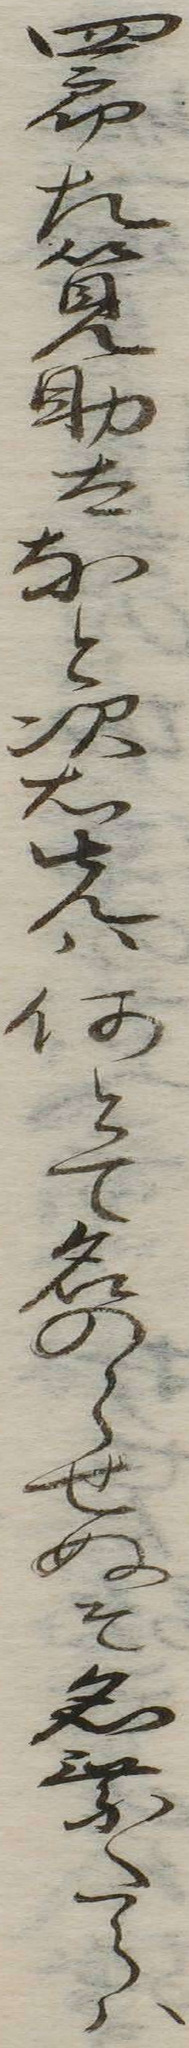四郎左筧助太なと次右先ハ何とて名のらせぬそ名乗たらハ
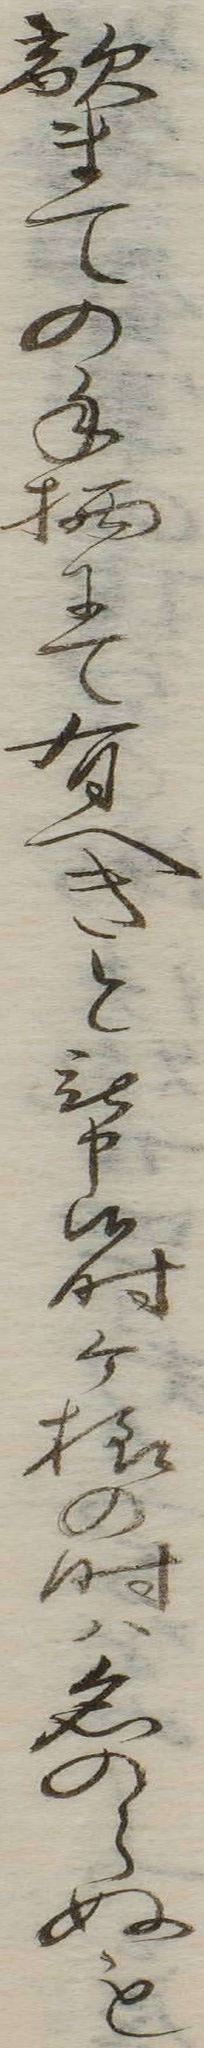敵まての手柄にて有へきと被申候時ケ様の時ハ名のらぬも
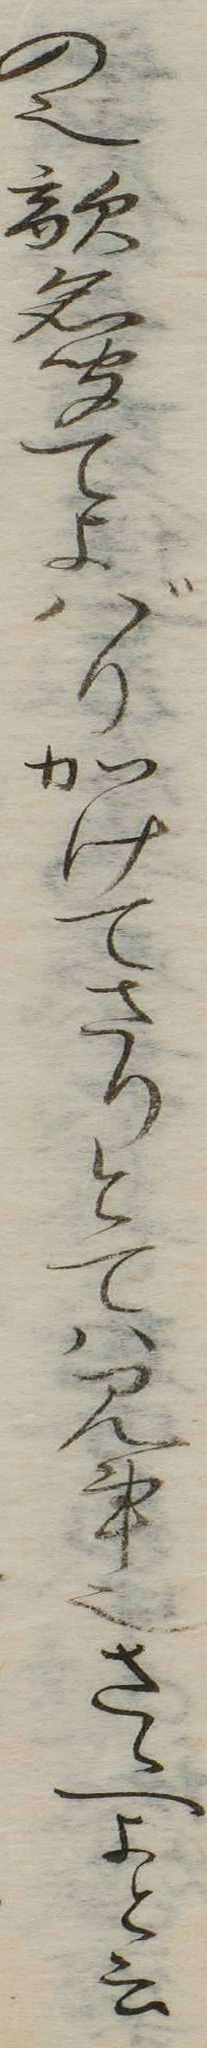の也敵名聞てよバりかけてさりとてハ見事也さ候へよと云
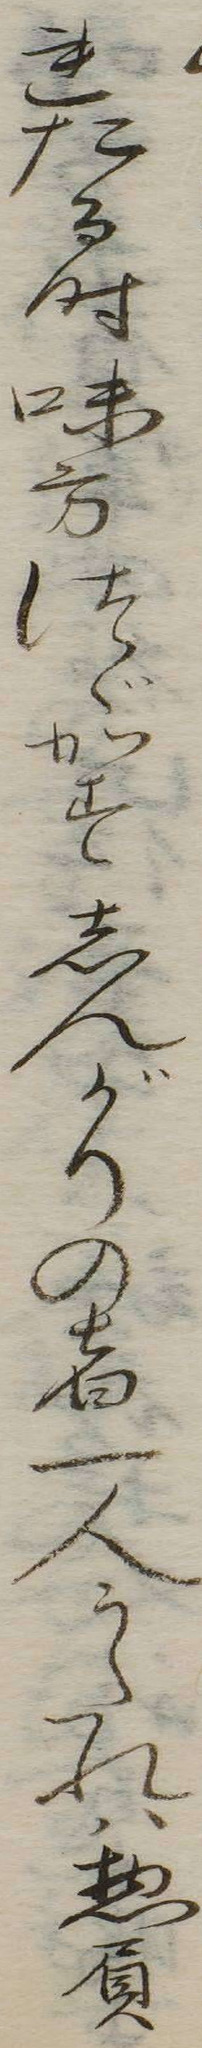れたる時味方つゞかすしんがりの者一人うたれハ惣負
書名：三河之物語
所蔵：国文学研究資料館
